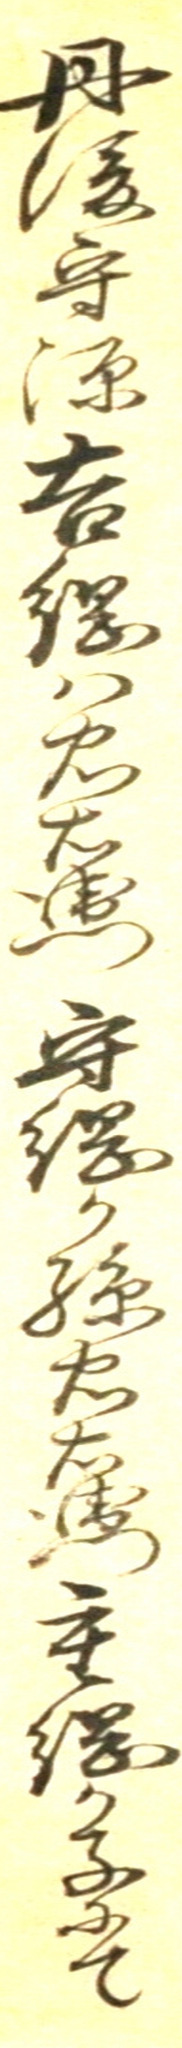丹後守源吉綱は忠右衛門守綱か孫忠右衛門重綱か子にて
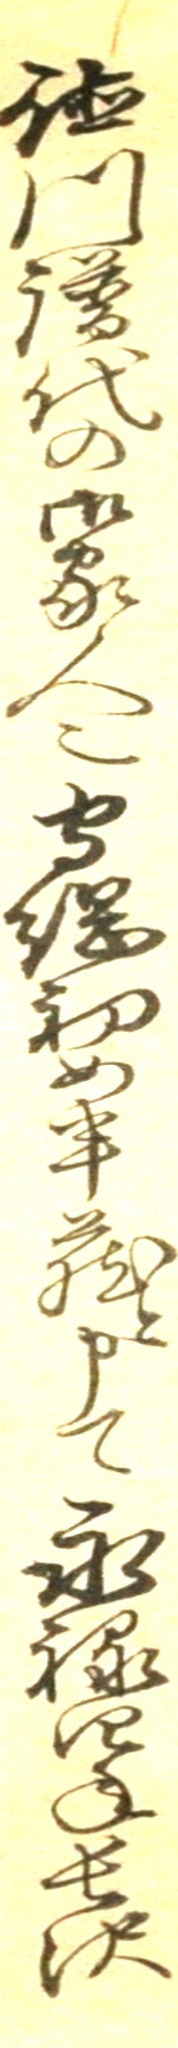徳川譜代の御家人也守綱初め半蔵と申て永禄四年長沢
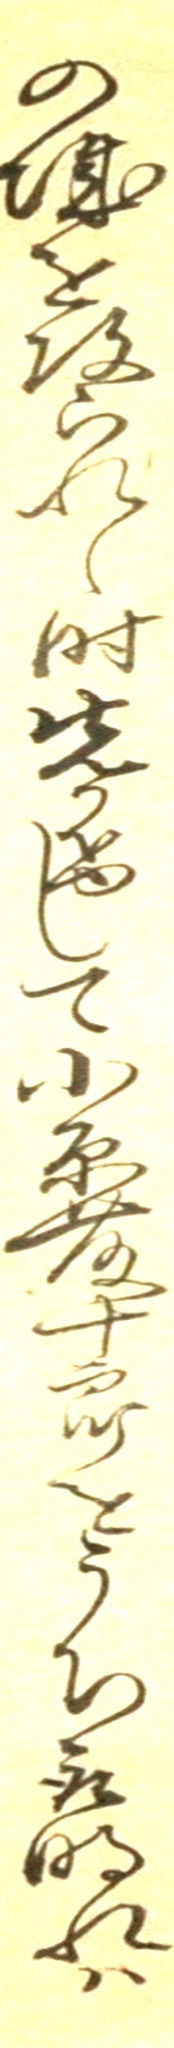の城を攻られし時先かけして小原藤十郎をうち取明れは
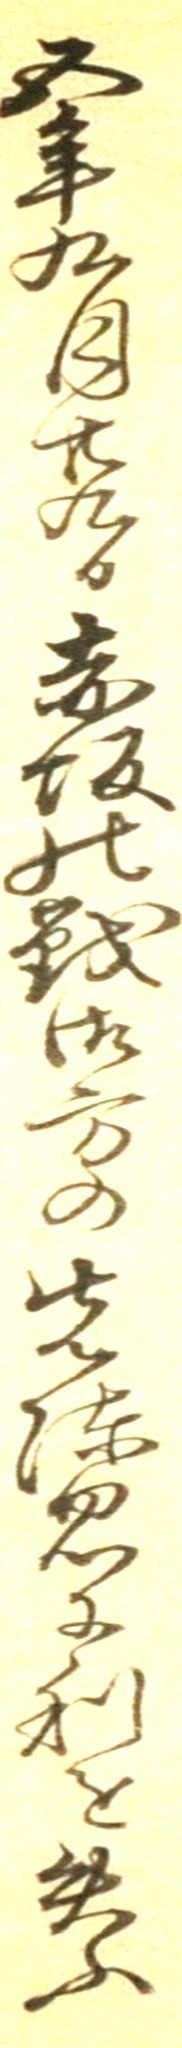五年九月廿九日赤坂の戦御方の先陣忽に利を失ふ
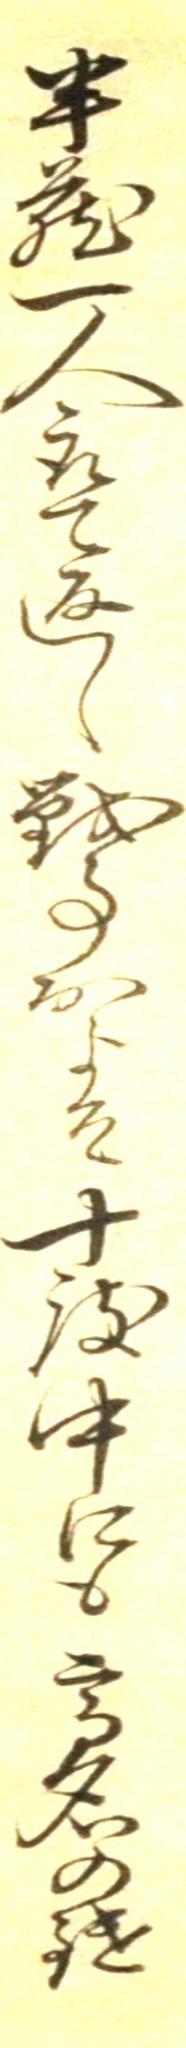半蔵一人取て返し戦事およそ十度中にも高名の鑓
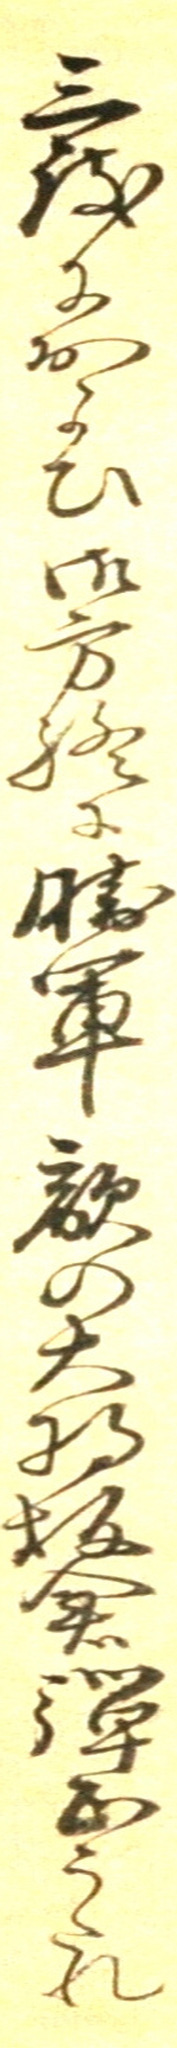三度におよひ御方終に勝軍敵の大将板倉弾正うたれ
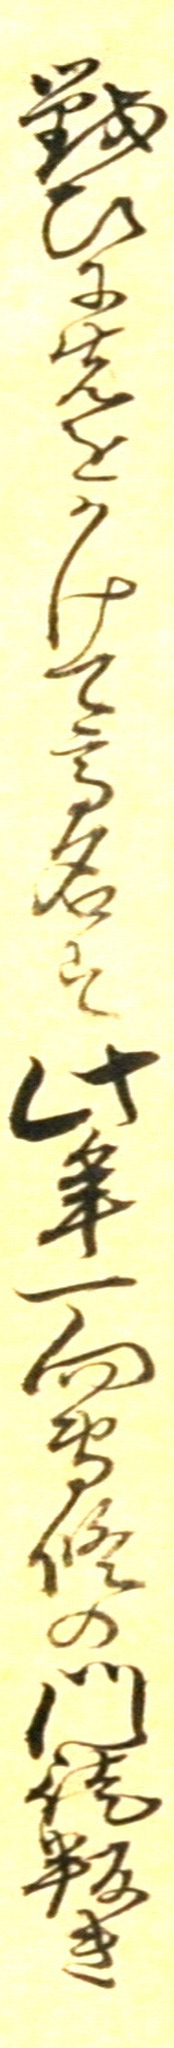戦ひに先をかけて高名す此年一向専修の門徒叛き

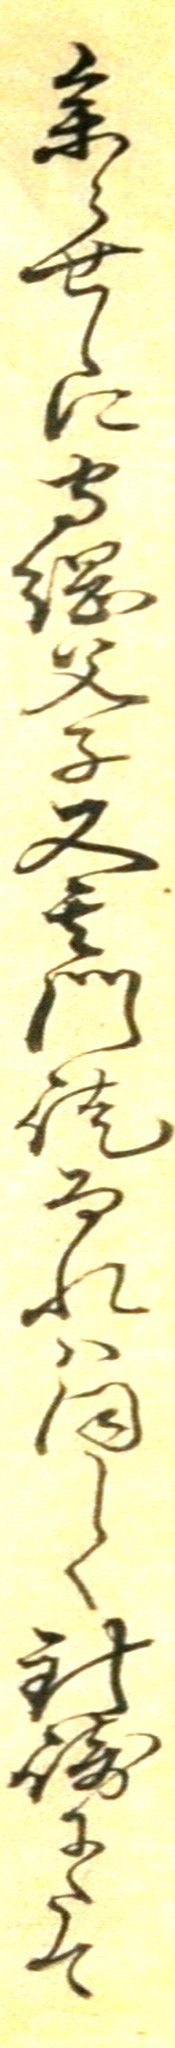参らせしに守綱父子又其門徒なれは同しく針崎にたて
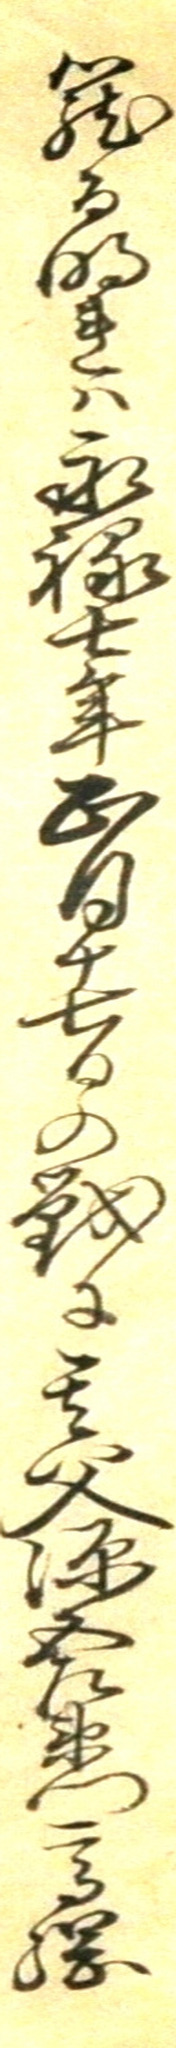籠る明れは永禄七年正月十七日の戦に其父源五左衛門高綱
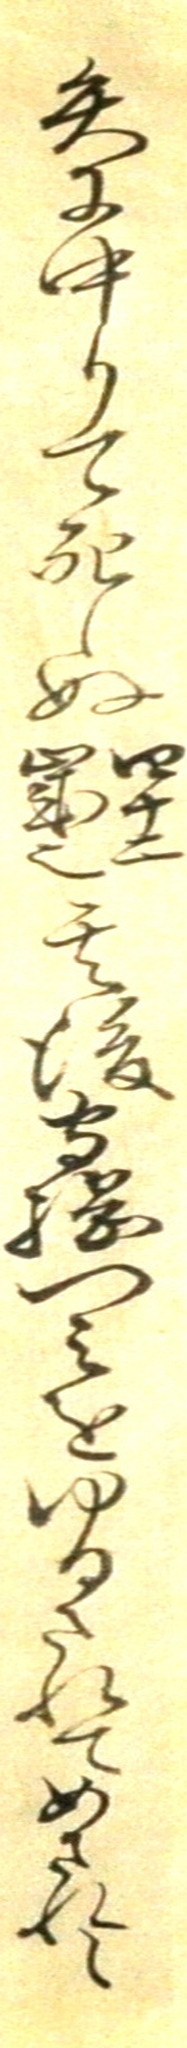矢に中りて死しぬ四十二歳也其後守綱つみをゆるされてめされし
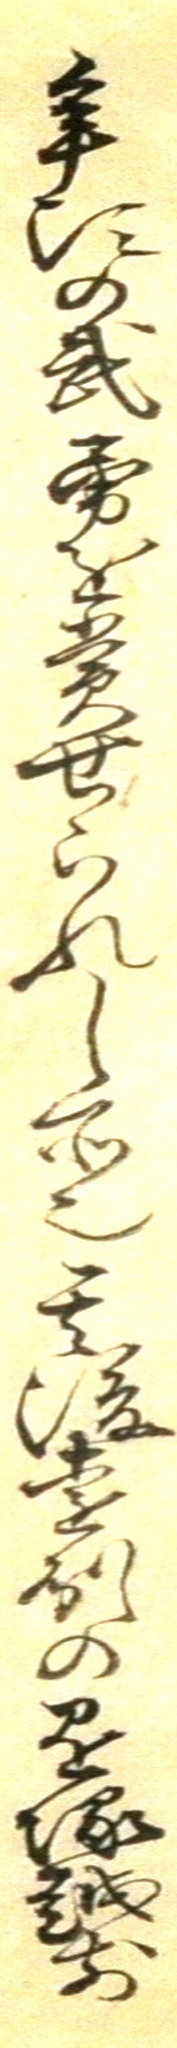年頃の武勇を賞せられし所也其後遠州の懸塚越前
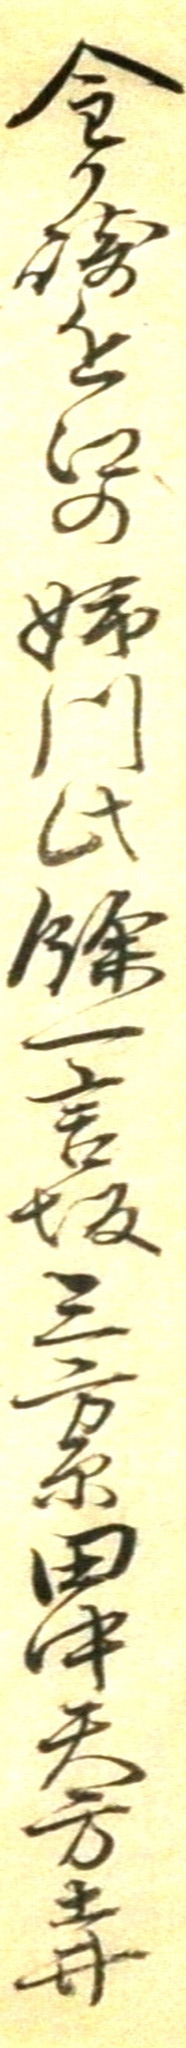金か崎近江の姉川此余一言坂三方原田中天方土井
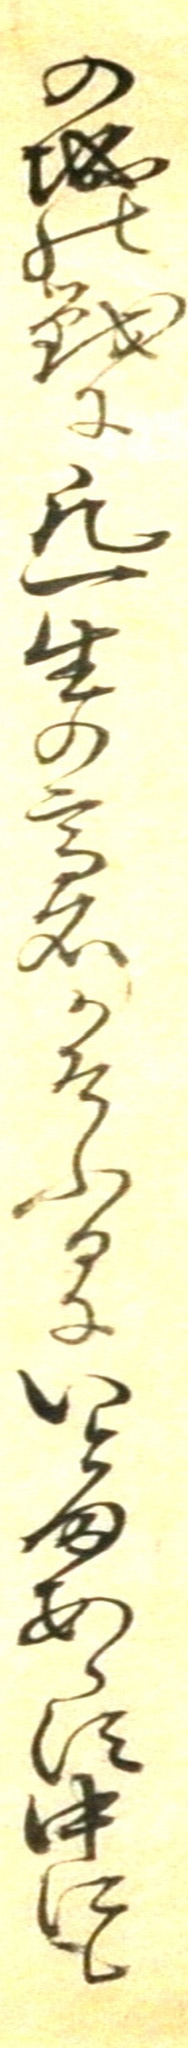の城の戦に凡一生の高名かそふるにいとまあらす中にも
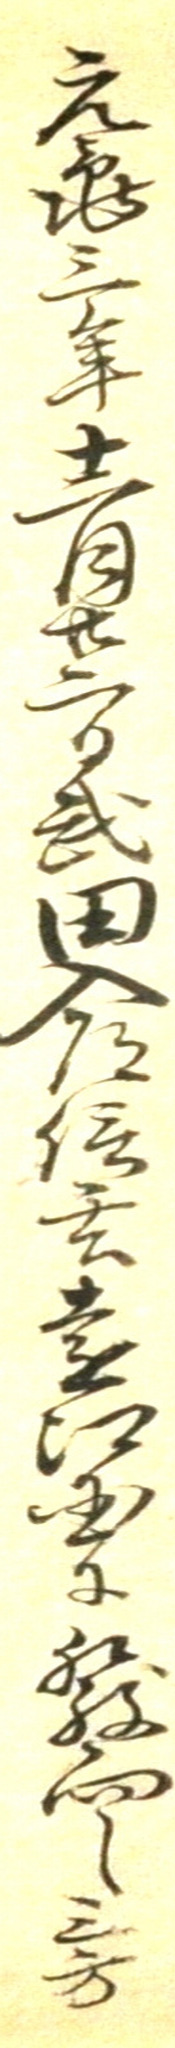元亀三年十二月廿二日武田入道信玄遠江国に発向し三方
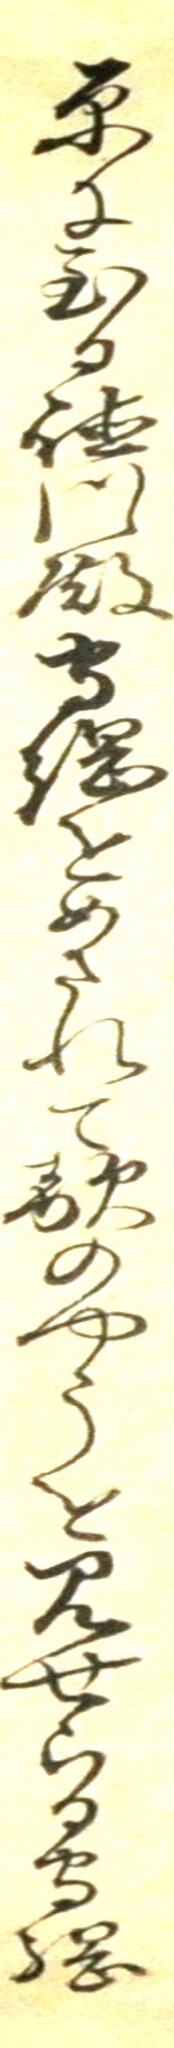原に至る徳川殿守綱をめされて敵のやうを見せらる守綱
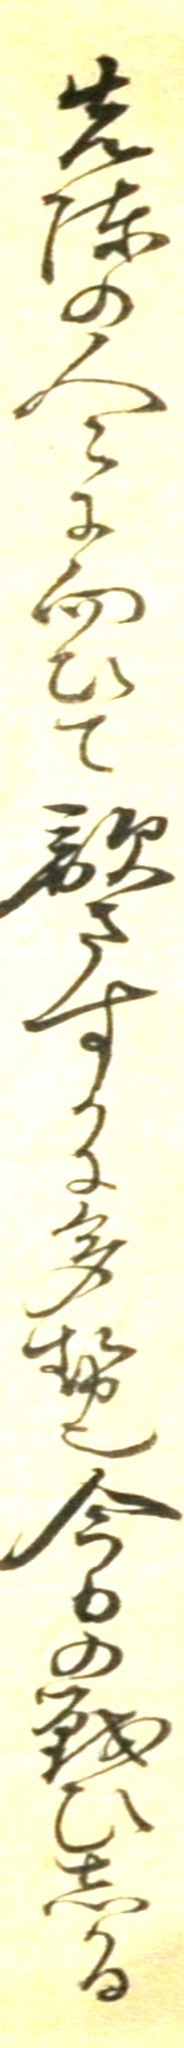先陣の人々に向ひて敵さすかに多勢也今日の戦ひしかる
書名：藩翰譜（四・中）
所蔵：伊那市立高遠町図書館・合同会社AMANE
